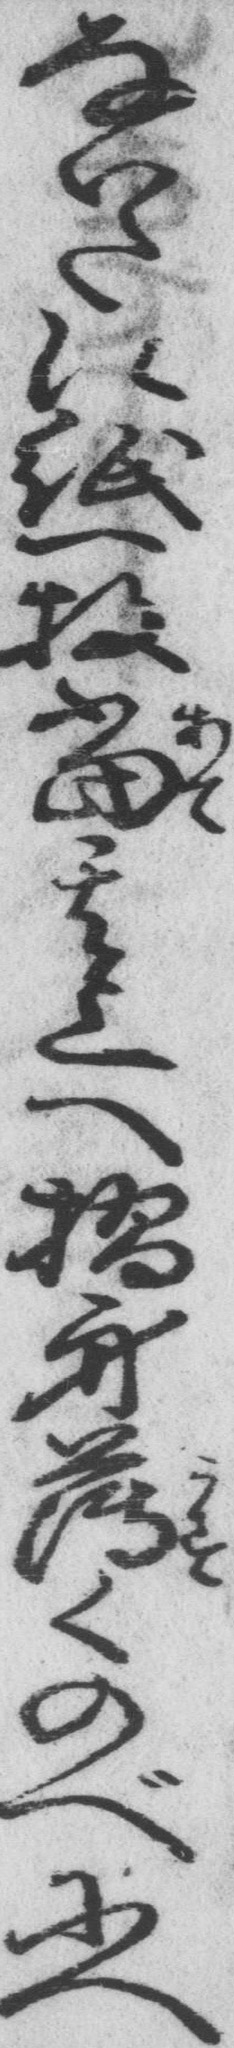ないたに紙一枚当其上へ摺身薄くのべにへ
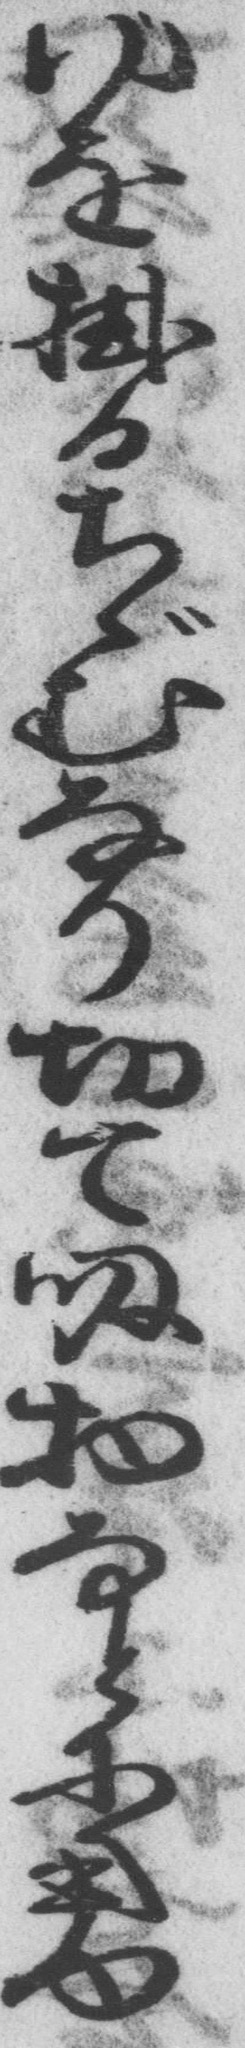ゆを掛るちゞむなり切て吸物なとに用ゆ
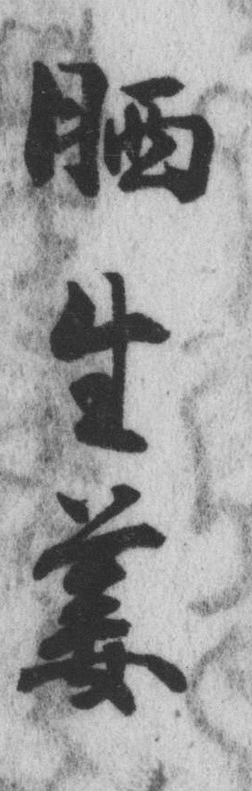晒生姜

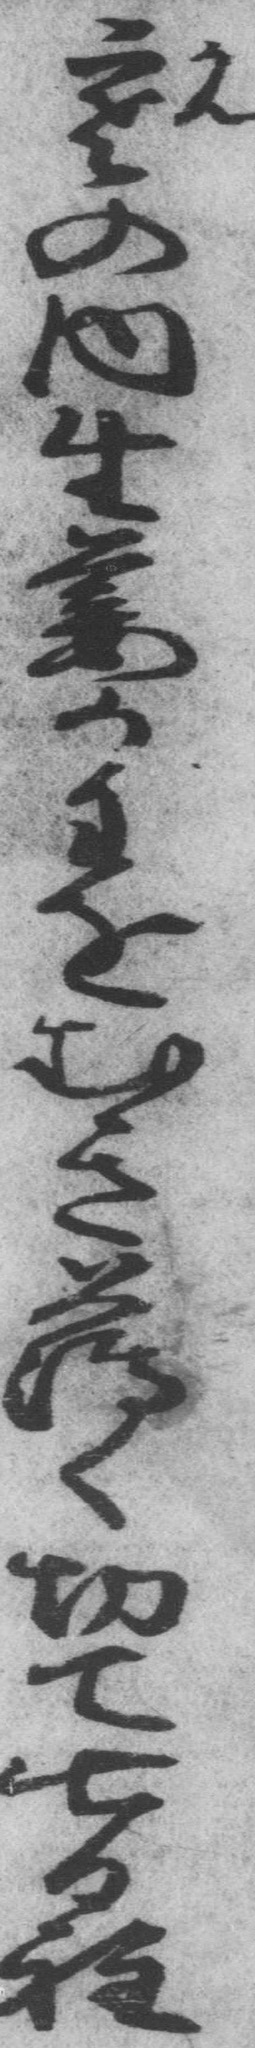寒の内生姜かわをむき薄く切て七日程
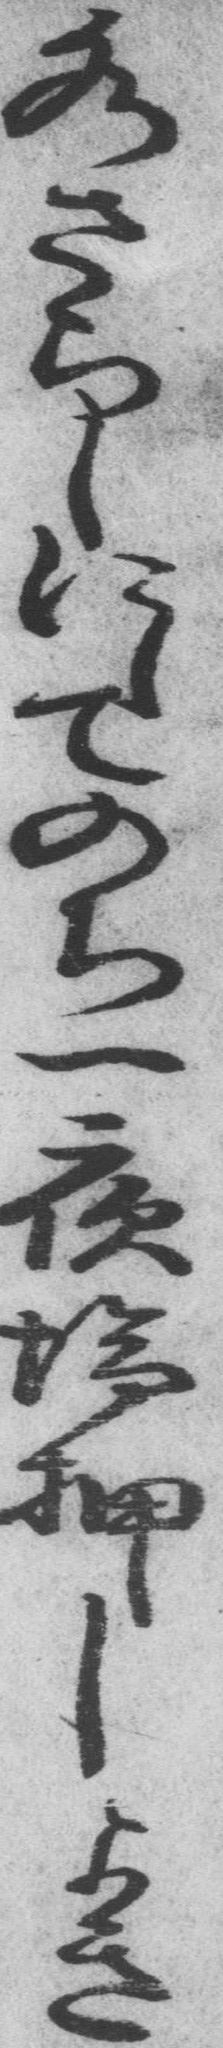水さらしにしてのち一夜塩押しよき
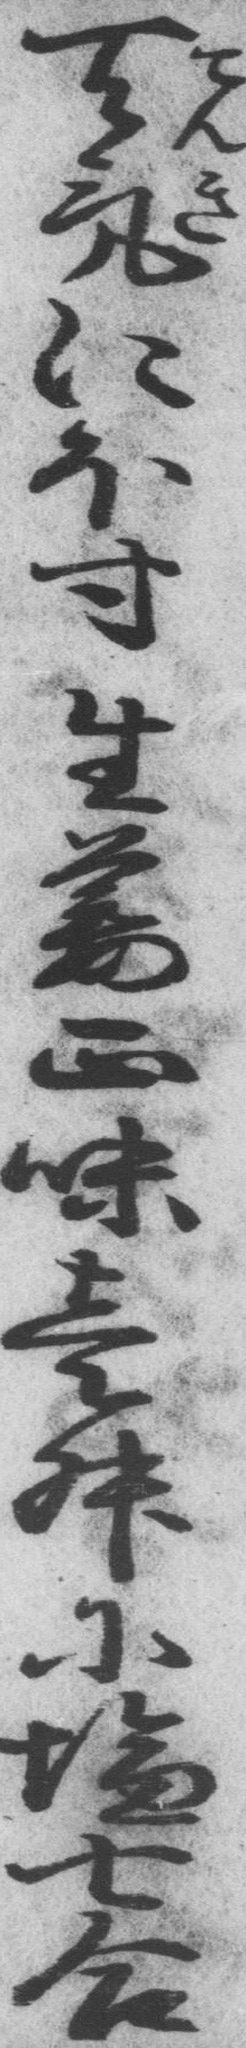天気にほす生姜正味壱升に塩七合
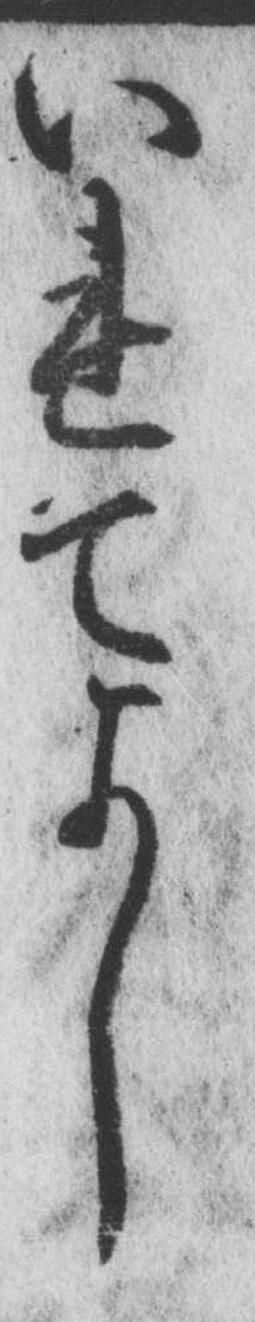いれてよし
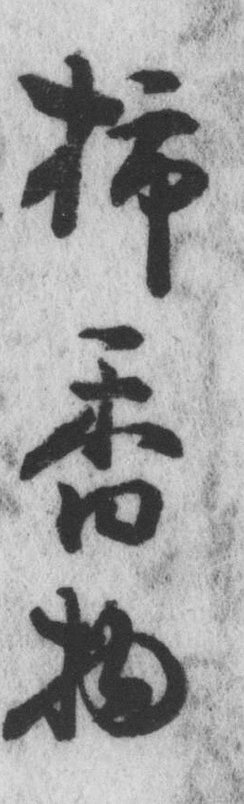柿香物
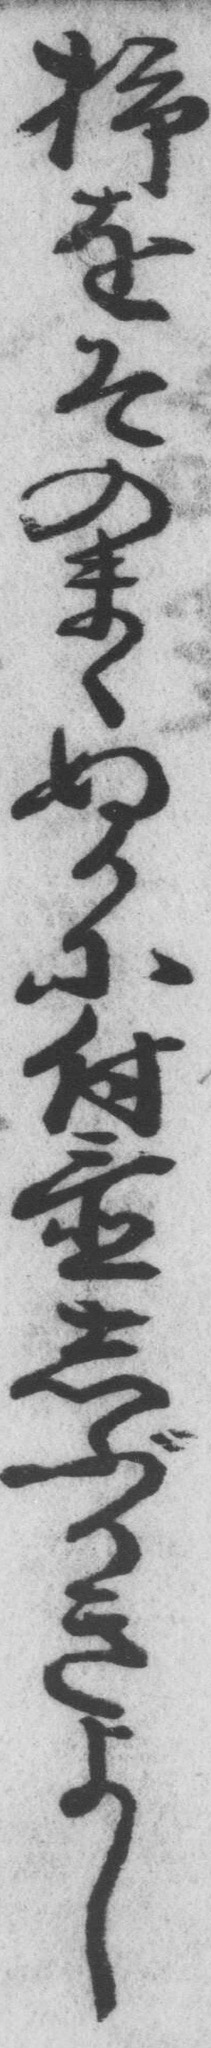柿をそのまゝぬかに付置しぶかきよし
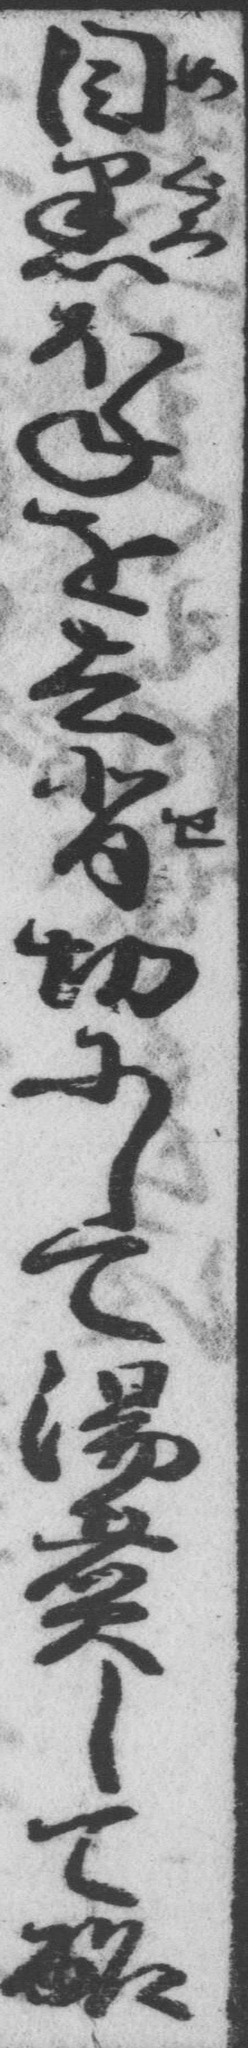目黒ほねを去背切にして湯煮して酢
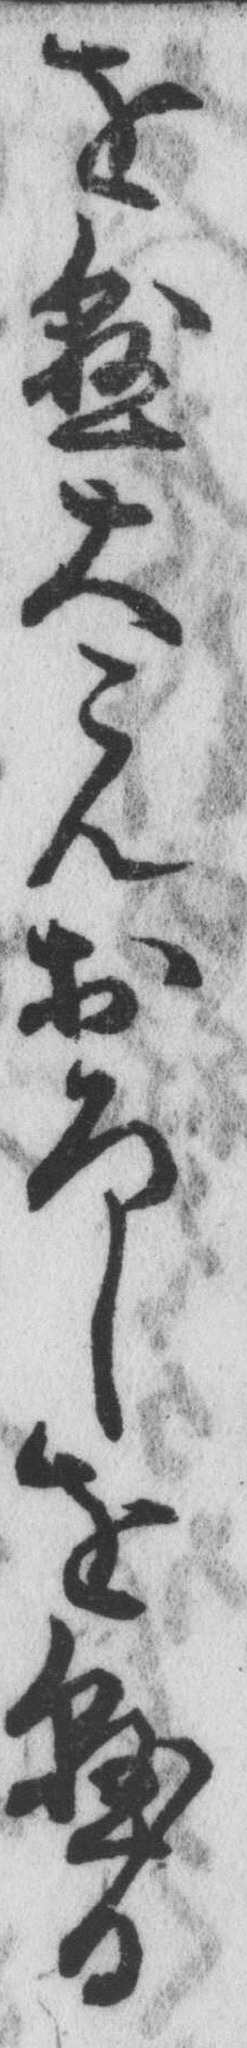を懸大こんおろしを懸る
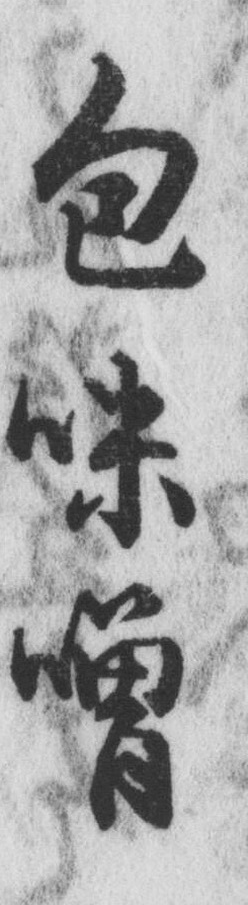包味噌
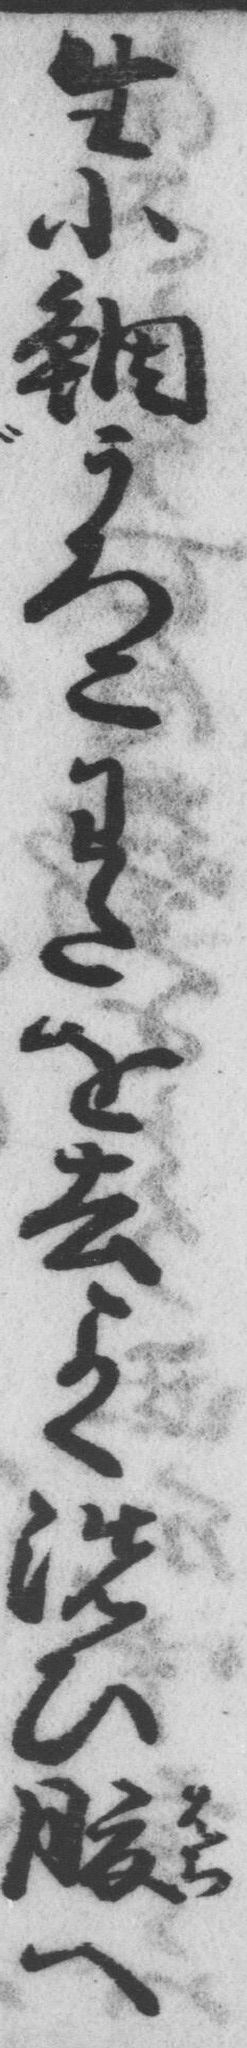生小鯛うろこわたを去よく洗ひ腹へ
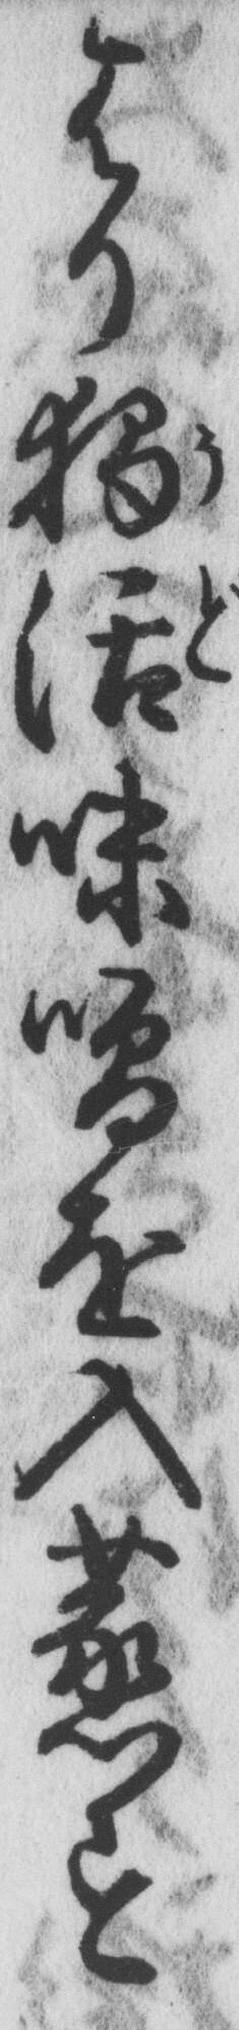はり独活味噌を入蒸す
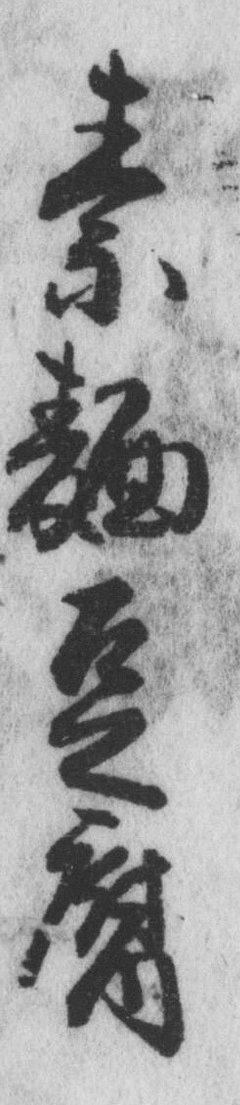素麺豆腐
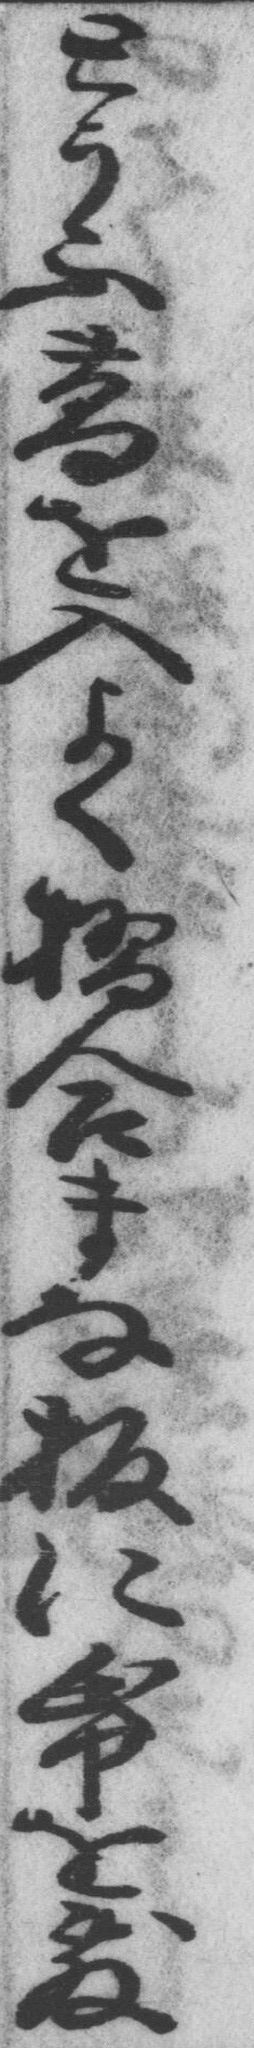とうふ葛を入よく摺合まな板に紙を敷
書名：料理山海郷
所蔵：大阪府立大学学術情報センター 国文学研究資料館
